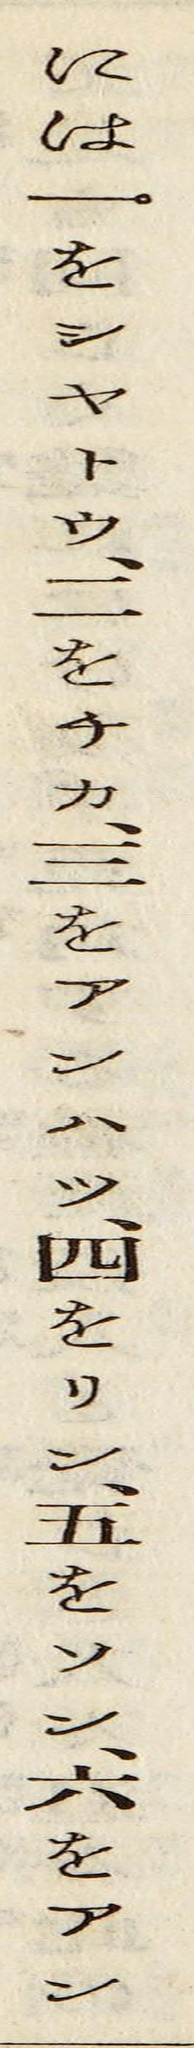には一をシヤトウ、二をチカ、三をアンハツ、四をリン、五をソン、六をアン
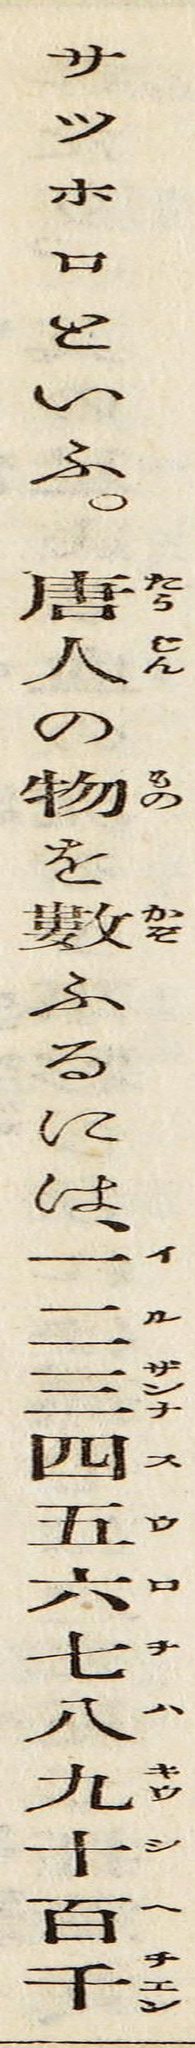サツホロといふ。唐人の物を数ふるには、一二三四五六七八九十百千
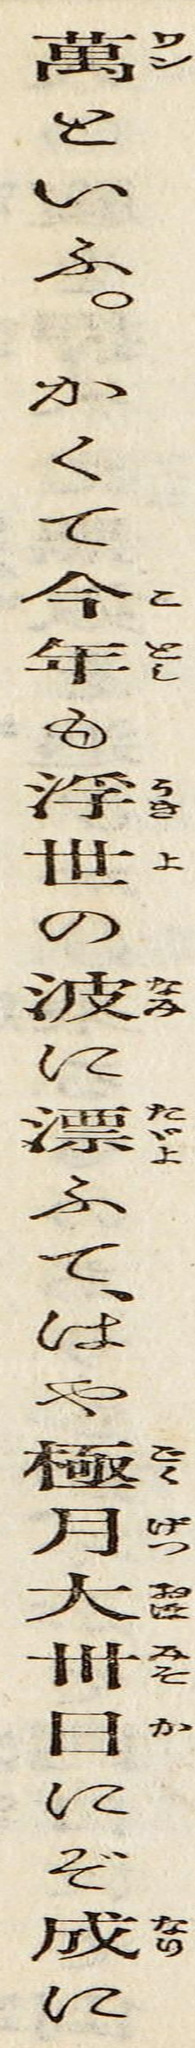万といふ。かくて今年も浮世の波に漂ふて、はや極月大卅日にぞ成に
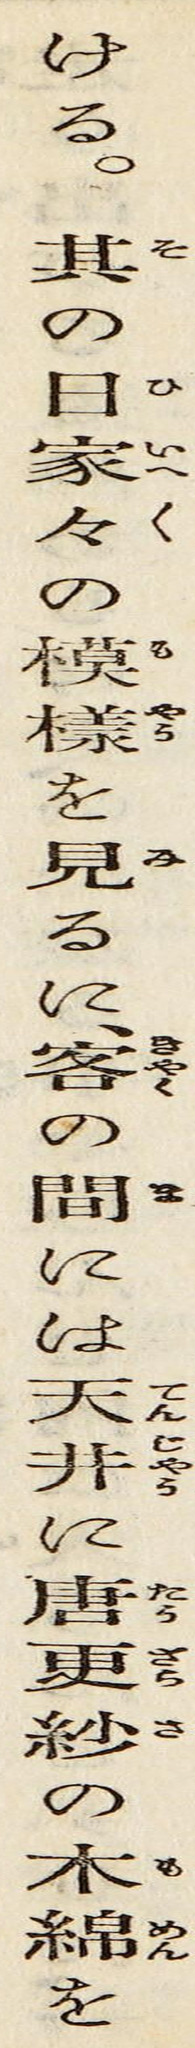ける。其の日家々の模様を見るに、客の間には天井に唐更紗の木綿を
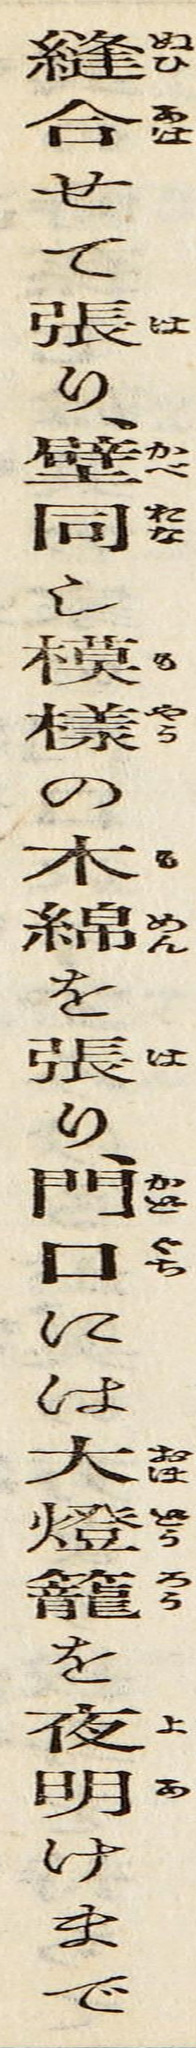縫合せて張り、壁同し模様の木綿を張り、門口には大灯籠を夜明けまで
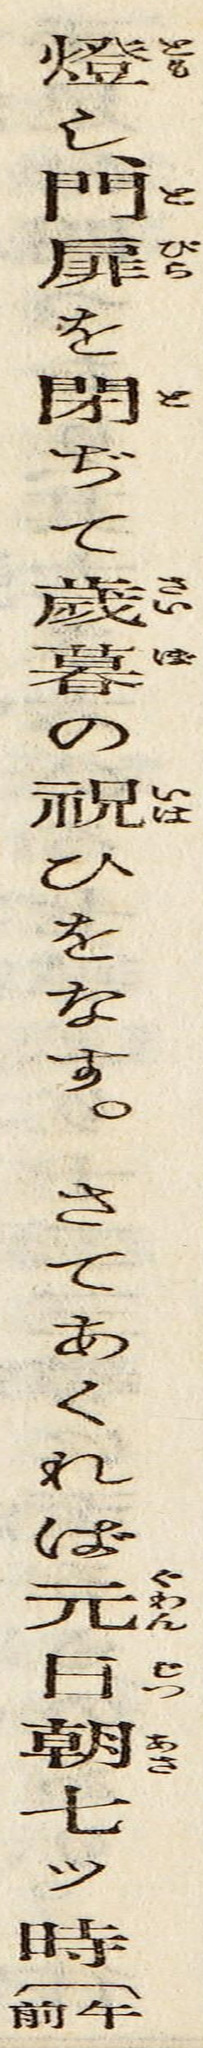灯し、門扉を閉ぢて歳暮の祝ひをなす。さてあくれば元日朝七ツ時[午前
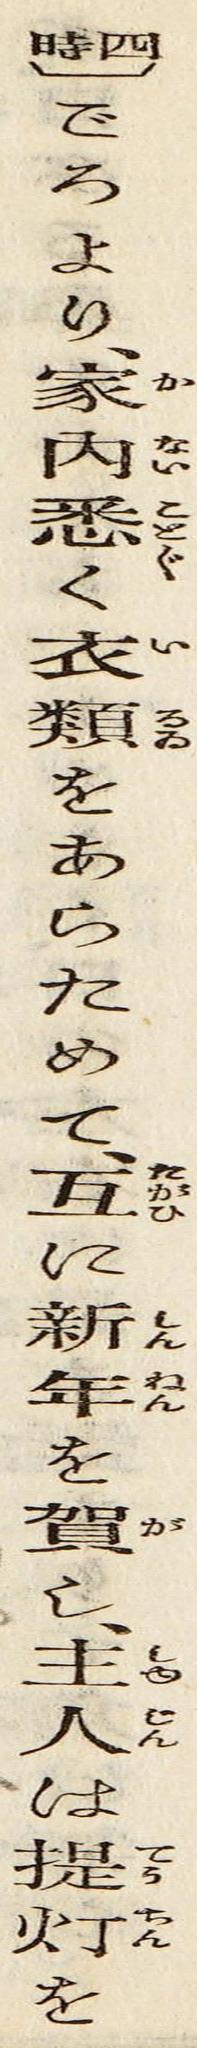四時]ごろより、家内悉く衣類をあらためて、互に新年を賀し、主人は提灯を
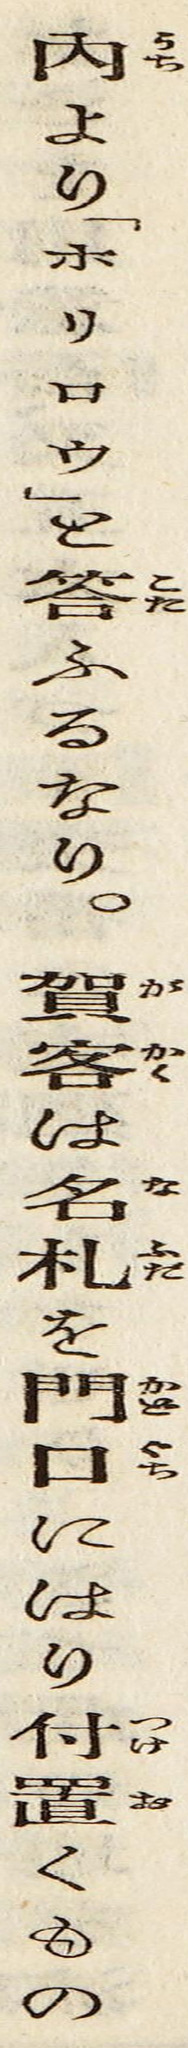内より「ホリロウ」と答ふるなり。賀客は名札を門口にはり付置くもの
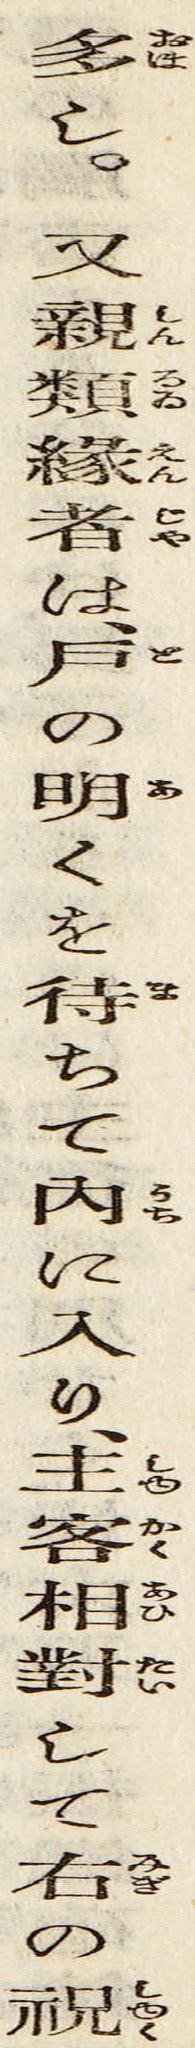多し。又親類縁者は、戸の明くを待ちて内に入り、主客相対して右の祝
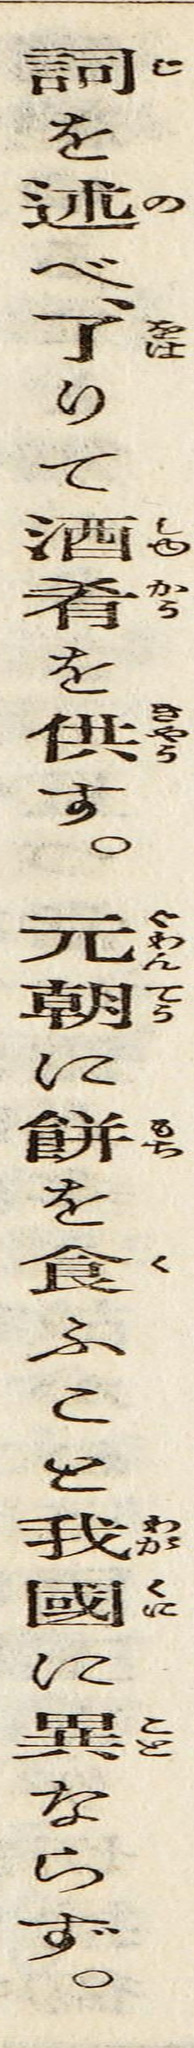詞を述べ、了りて酒肴を供す。元朝に餅を食ふこと我国に異ならず。
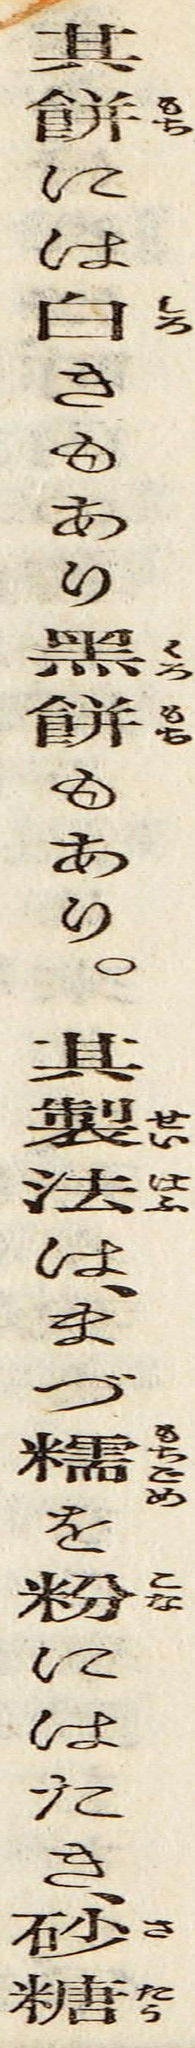其餅には白きもあり黒餅もあり。其製法は、まづ糯を粉にはたき、砂糖
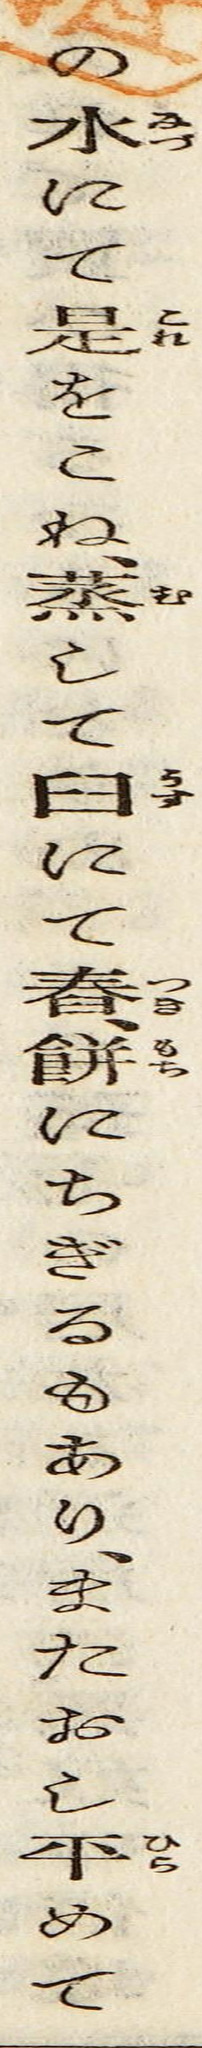の水にて是をこね、蒸して臼にて舂、餅にちぎるもあり、またおし平めて
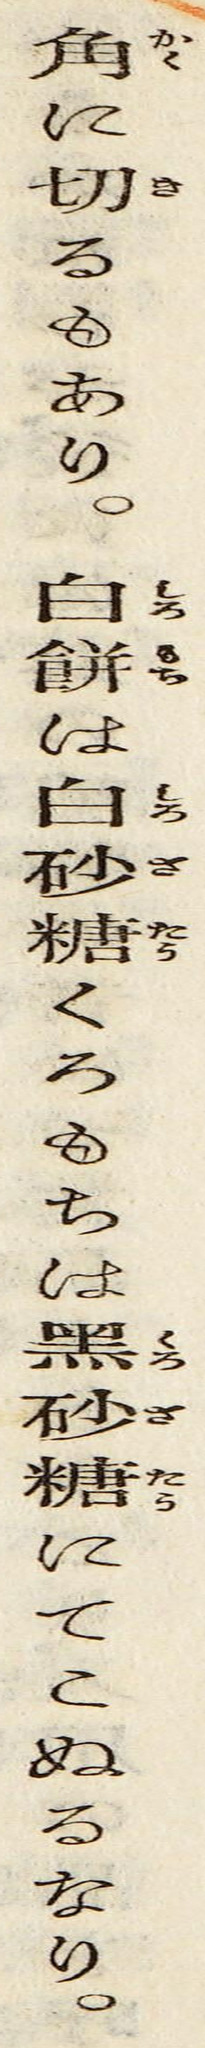角に切るもあり。白餅は白砂糖くろもちは黒砂糖にてこぬるなり。
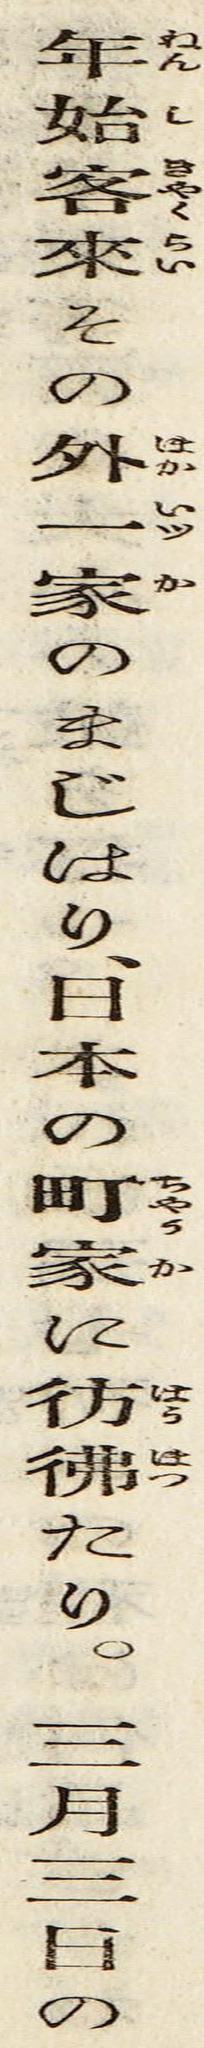年始客来その外一家のまじはり、日本の町家に彷彿たり。三月三日の
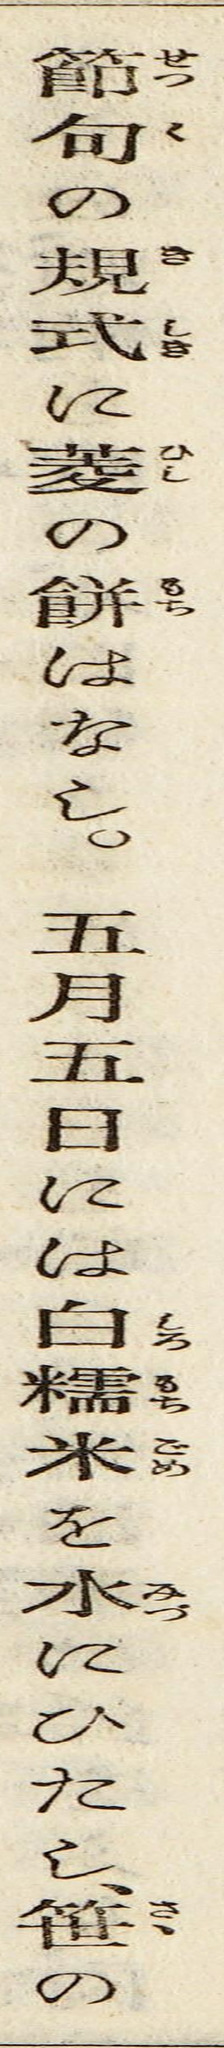節句の規式に菱の餅はなし。五月五日には白糯米を水にひたし、笹の
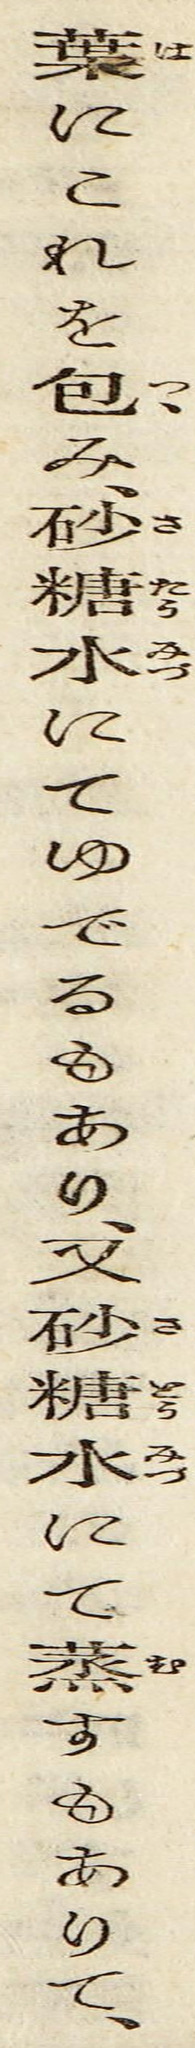葉にこれを包み、砂糖水にてゆでるもあり、又砂糖水にて蒸すもありて、
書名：日本漂流譚
